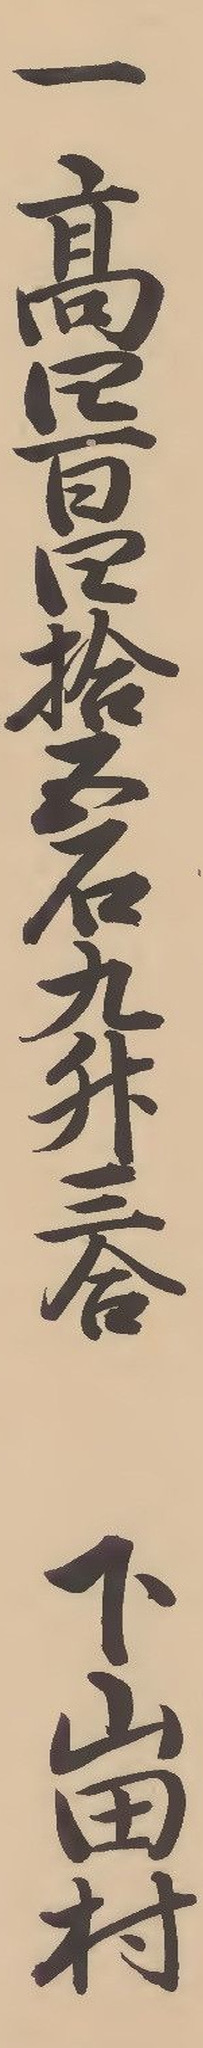一高四百四拾五石九升三合下山田村
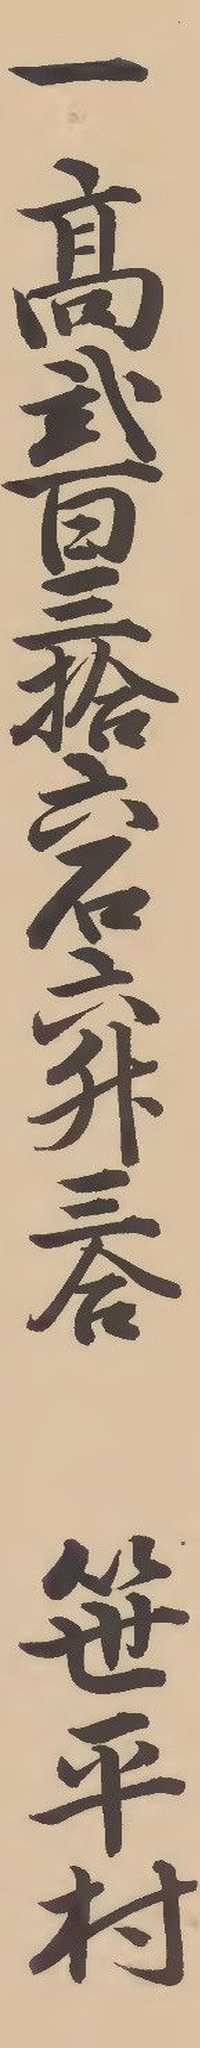一高弐百三拾六石六升三合笹平村
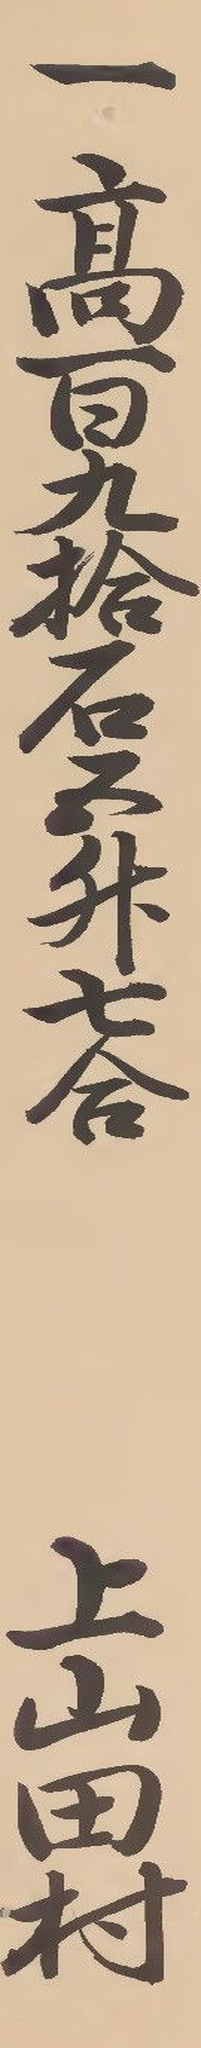一高百九拾石五升七合上山田村
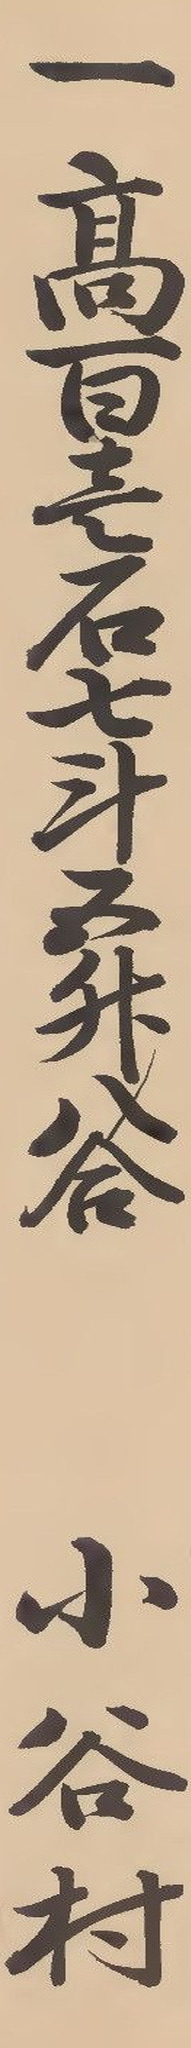一高百壱石七斗五升八合小谷村
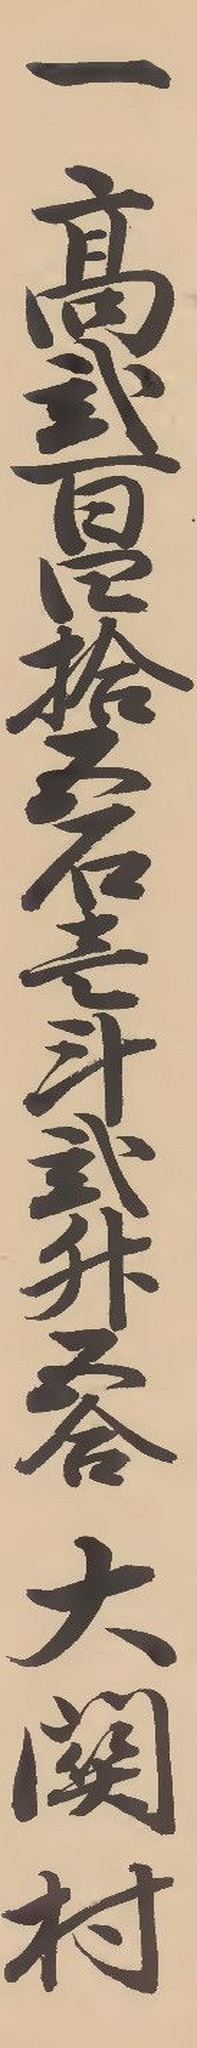一高弐百四拾五石壱斗弐升五合大関村
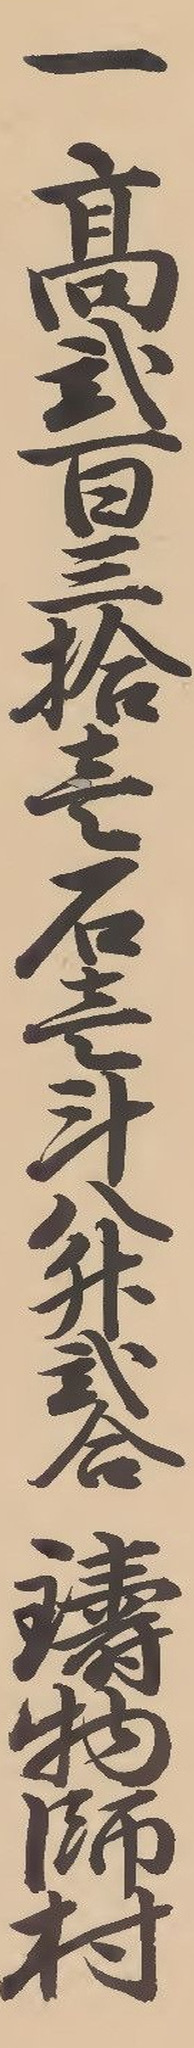一高弐百三拾壱石壱斗八升弐合鋳物師村

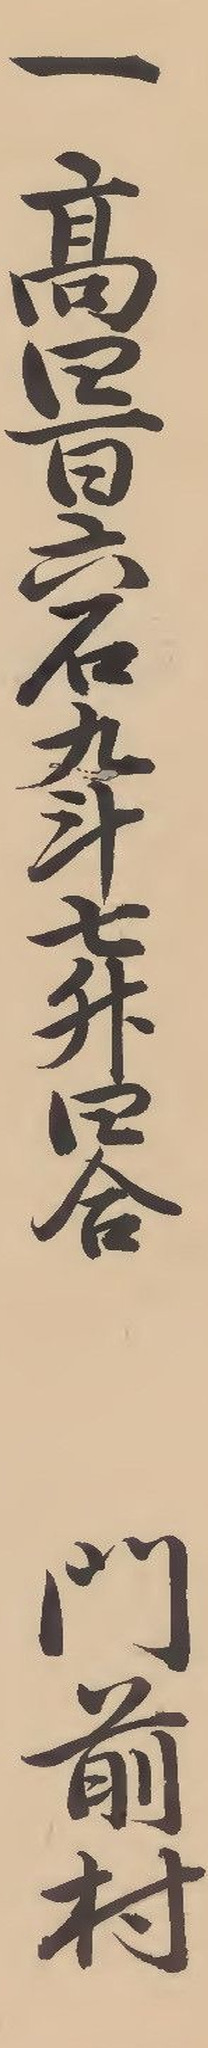一高四百六石九斗七升四合門前村
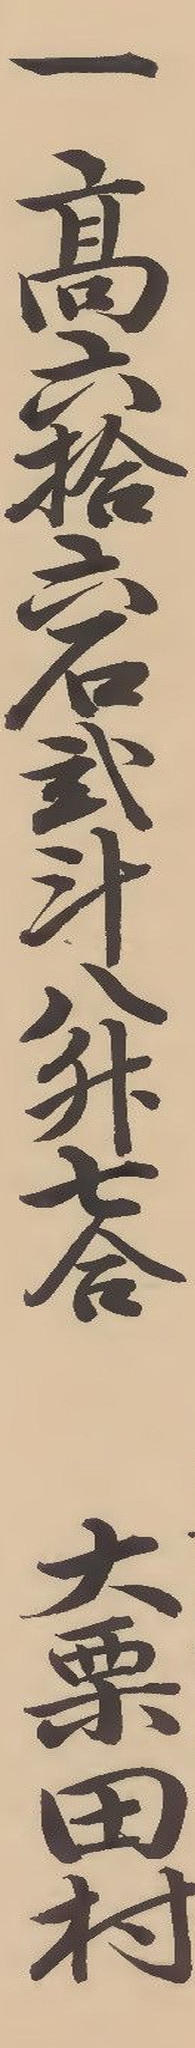一高六拾六石弐斗八升七合大栗田村
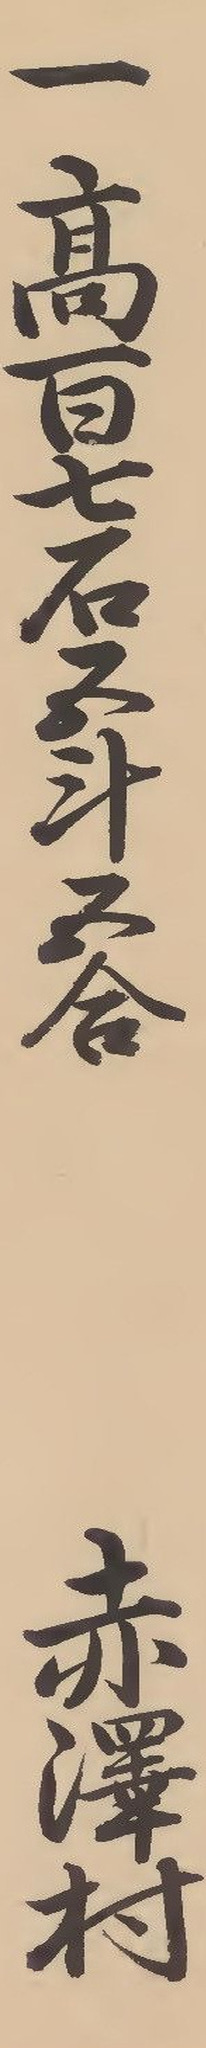一高百七石五斗五合赤沢村
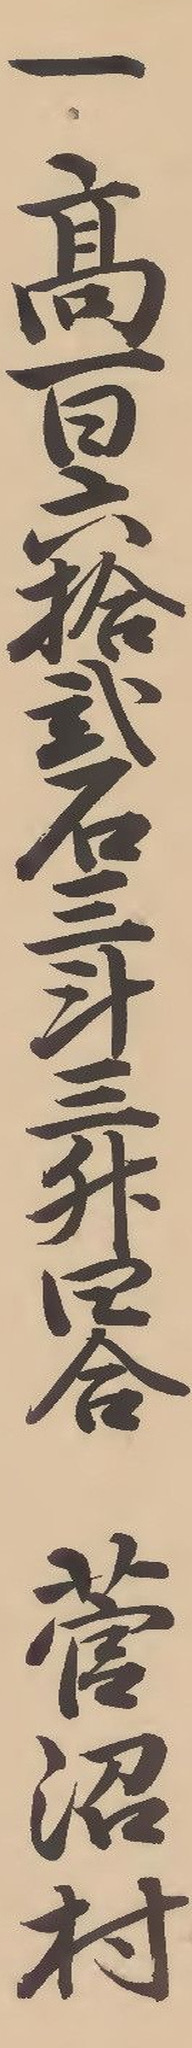一高百六拾弐石三斗三升四合菅沼村
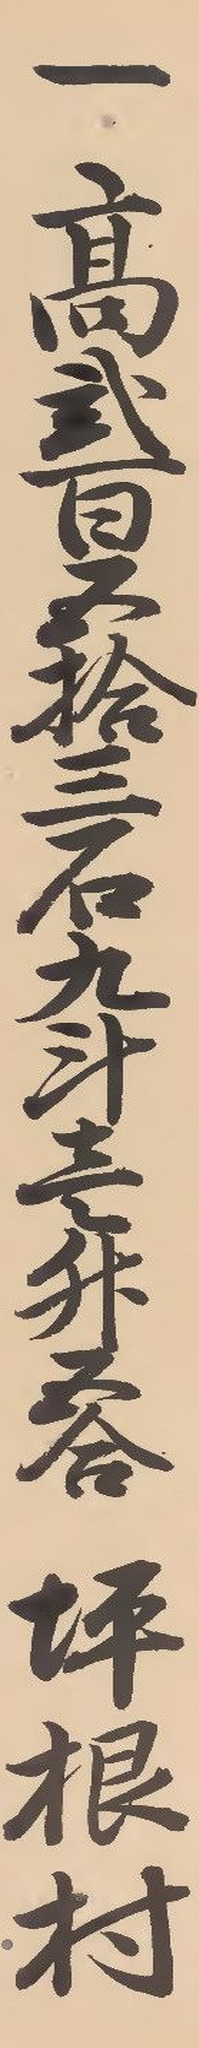一高弐百五拾三石九斗壱升五合坪根村
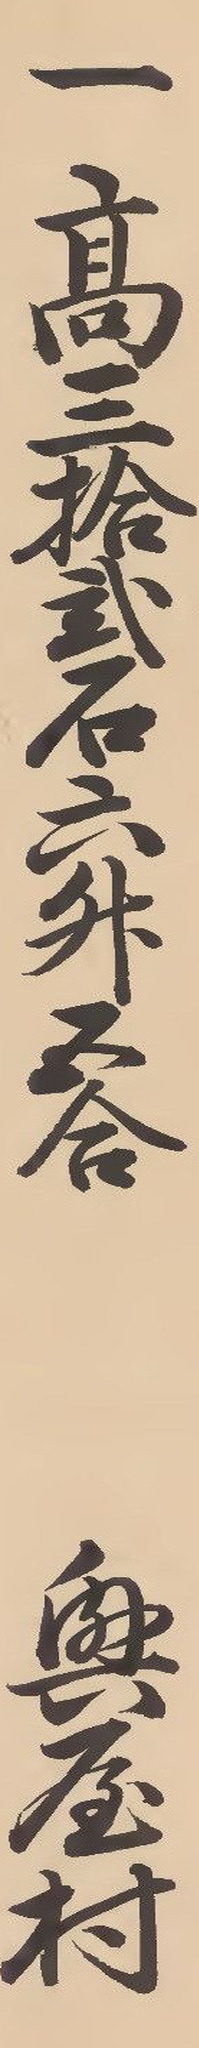一高三拾弐石六升五合興屋村
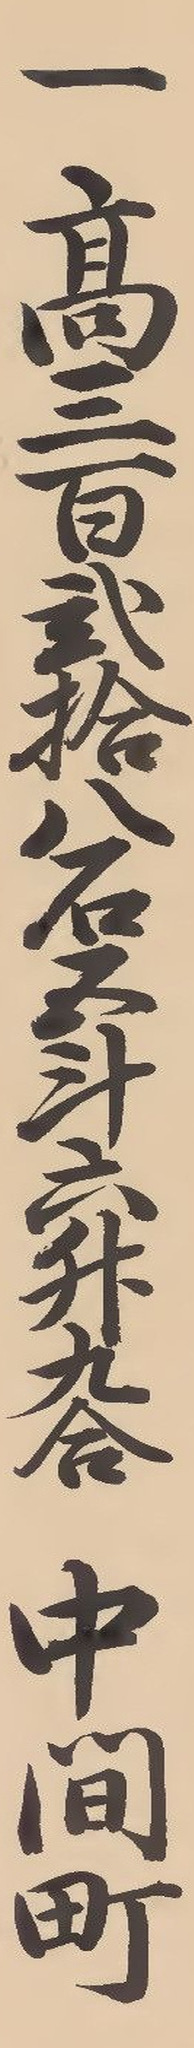一高三百弐拾八石五斗六升九合中間町
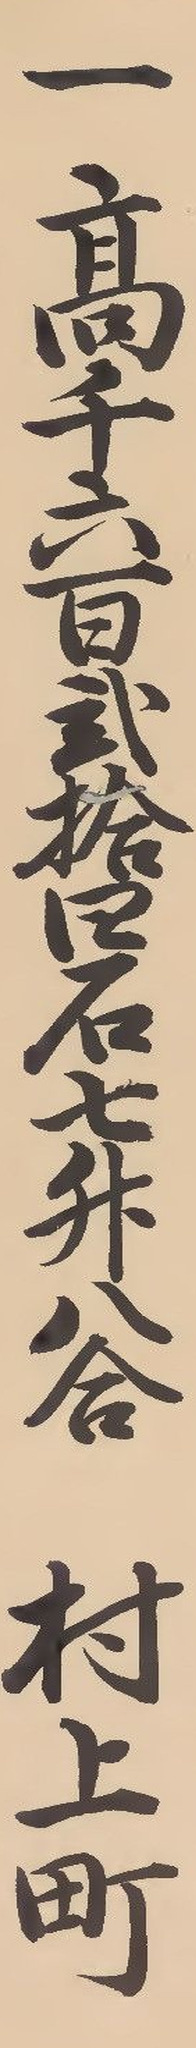一高千六百弐拾四石七升八合村上町

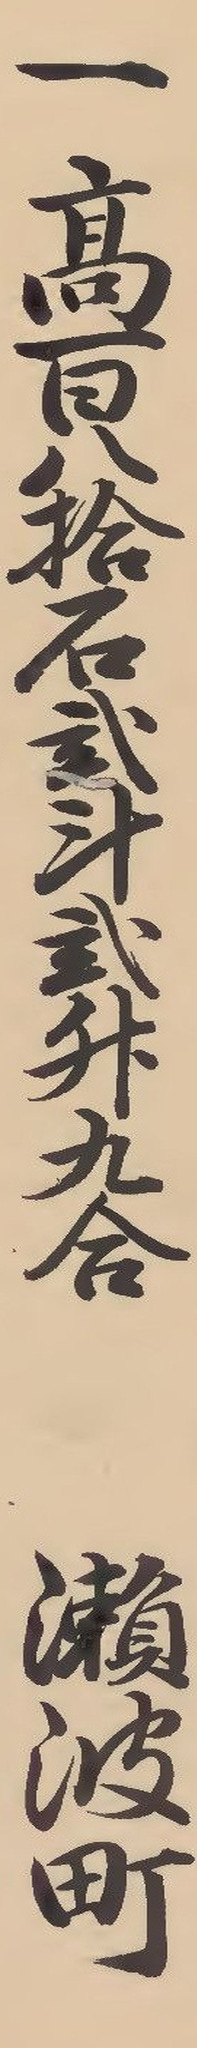一高百八拾石弐斗弐升九合瀬波町
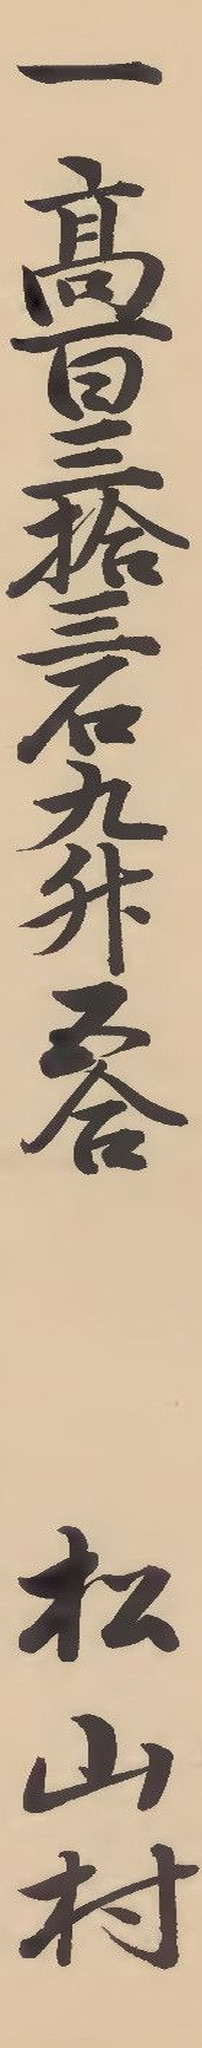一高百三拾三石九升五合松山村
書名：越後国郷帳　下
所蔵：国立公文書館 National Archives of Japan
